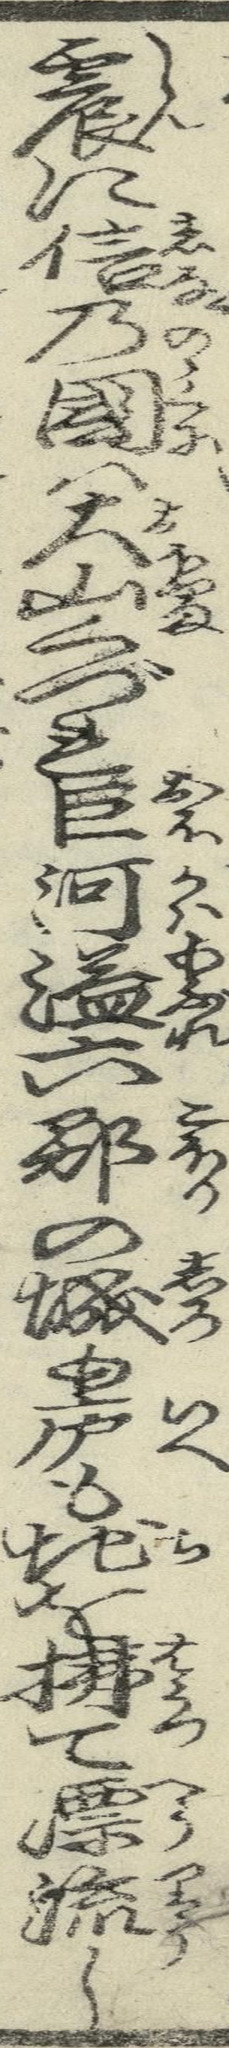震に信乃国は大山くづれ巨河溢六郡の城も廬も地を拂て漂流し
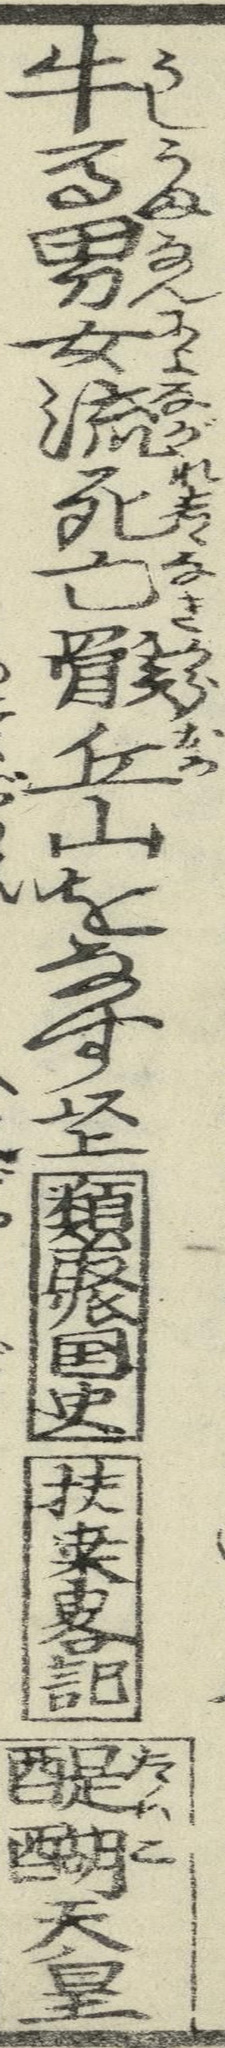牛馬男女流死亡骸丘山をなす以上類聚国史扶桑略記醍醐天皇
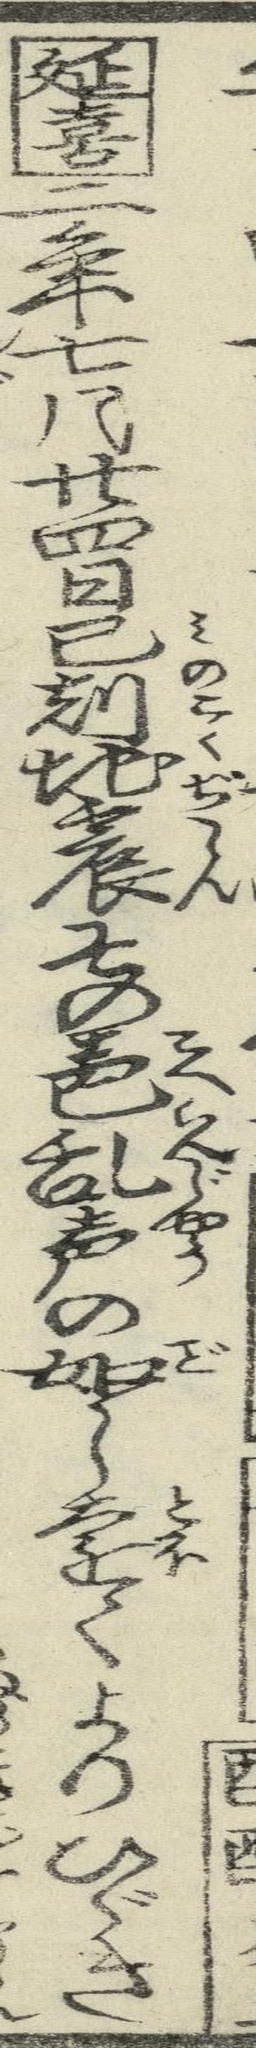延喜二年七月廿四日巳刻地震その声乱声の如く遠くよりひゞき
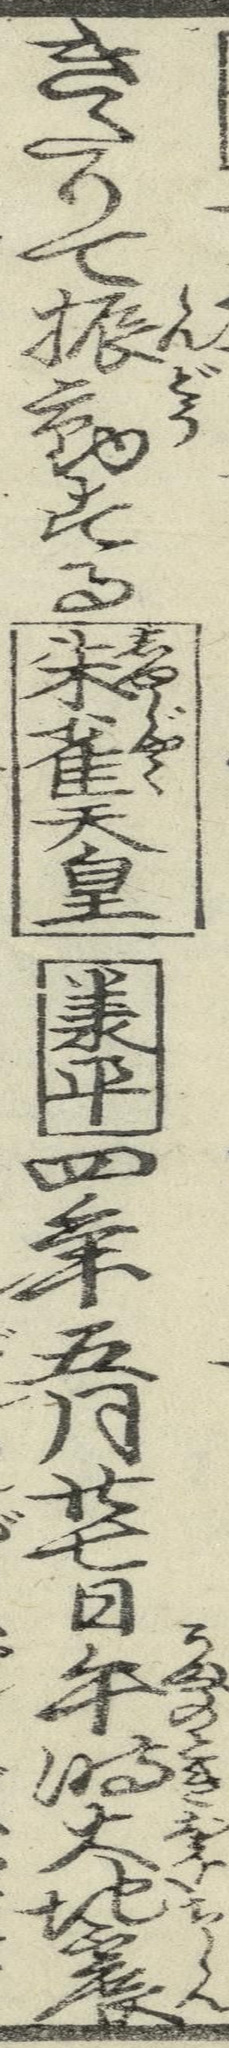きたりて振動する朱雀天皇承平四年五月廿七日午時大地震
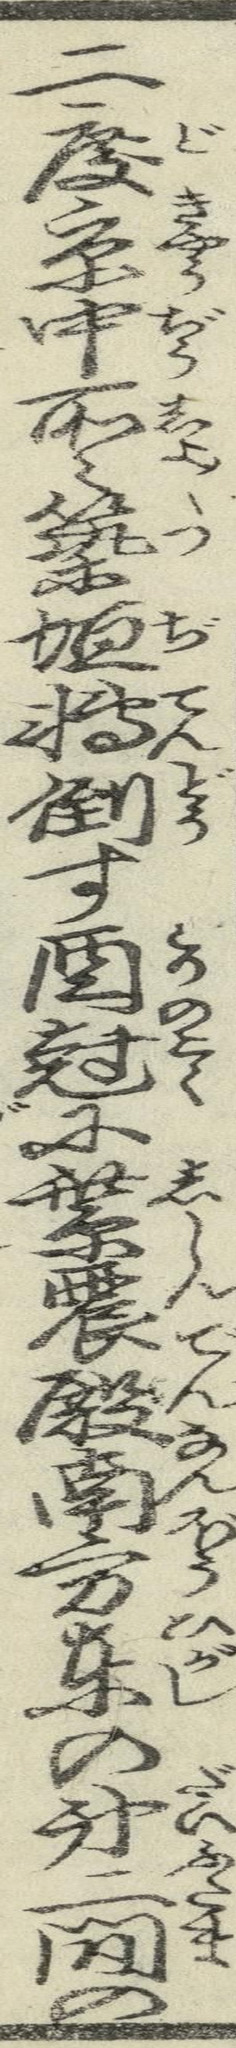二度京中所々築垣転倒す酉尅に紫宸殿南方東の第二間の
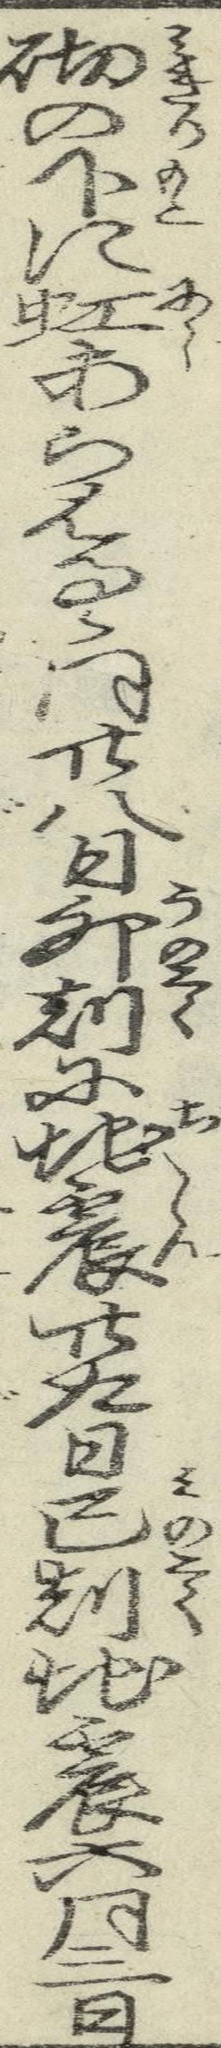砌の下に虹あらはるゝ同廿八日卯刻に地震廿九日巳刻地震六月三日
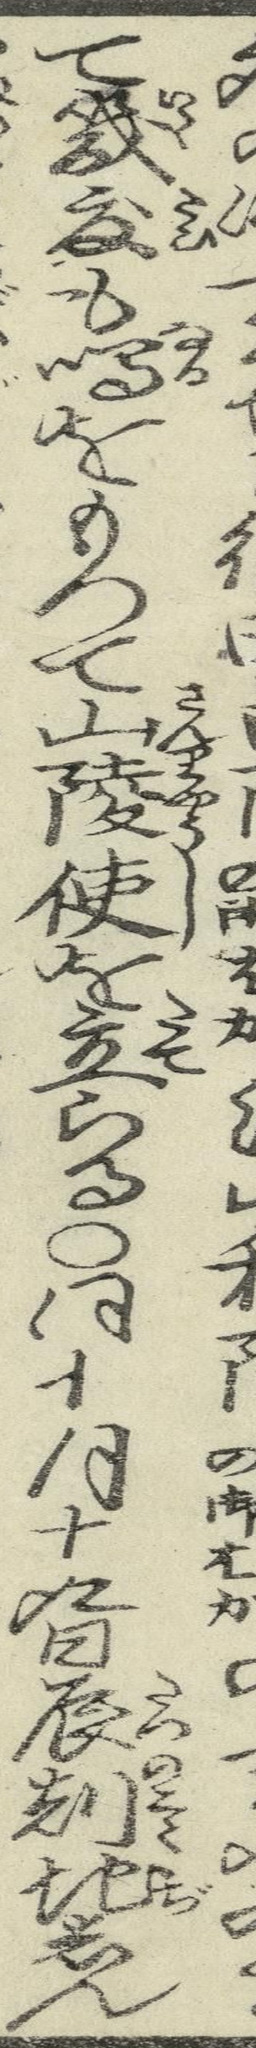て幾度も鳴をもつて山陵使を立らる〇同十月十九日辰刻地しん
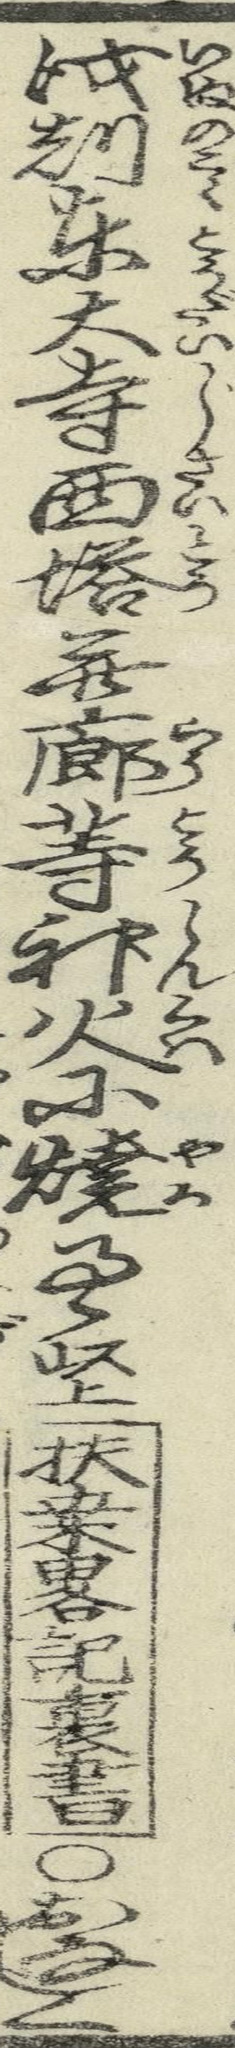戌刻東大寺西塔幷廊等神火に焼るゝ以上扶桑略記裏書〇おなじく
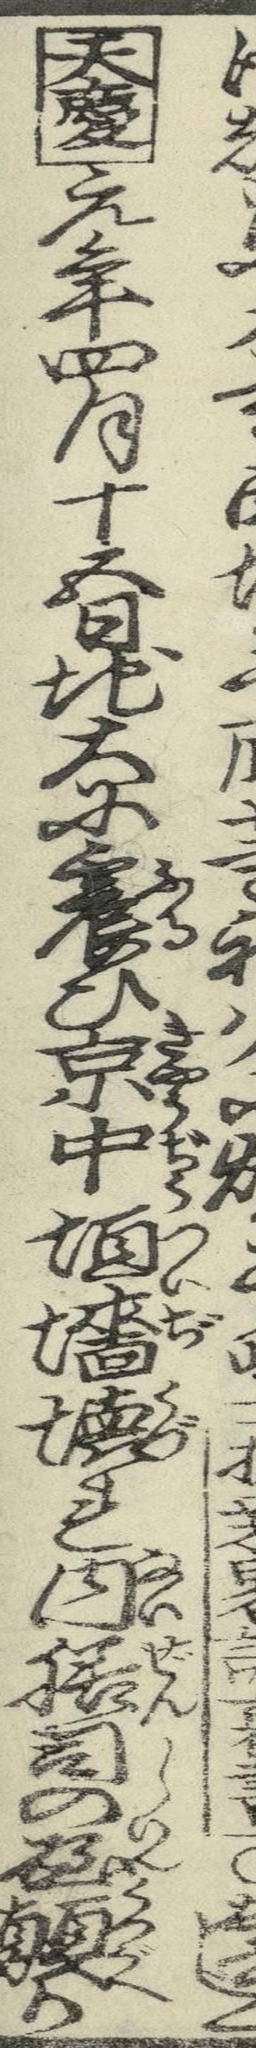天慶元年四月十五日地大に震ひ京中垣墻壊れ内膳司の極顛り
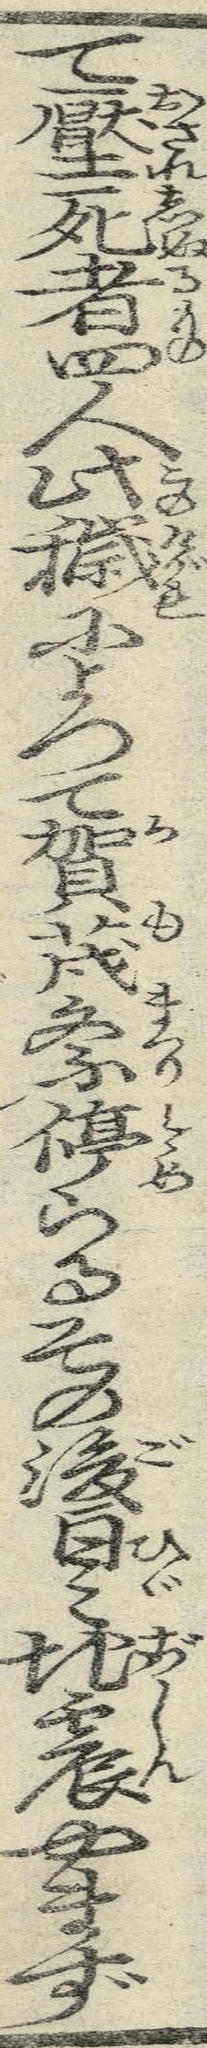て圧死者四人此穢によつて賀茂祭停らるその後日々地震やまず
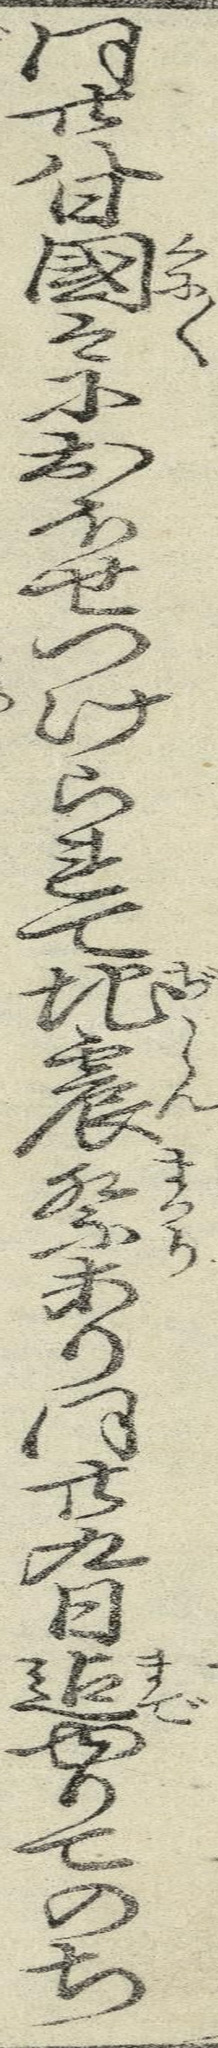同廿八日国々におほせつけられて地震祭あり同廿九日迄ゆりてのち
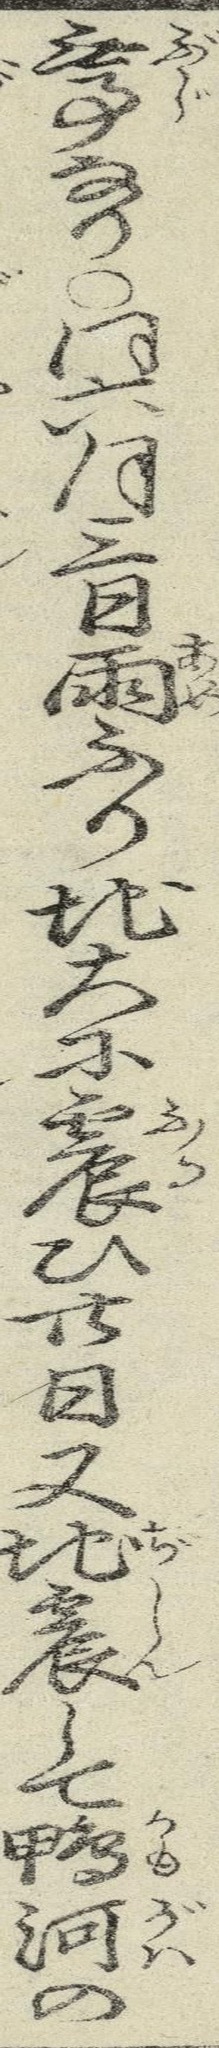無事なり〇同六月三日雨ふり地大に震ひ廿日又地震して鴨河の
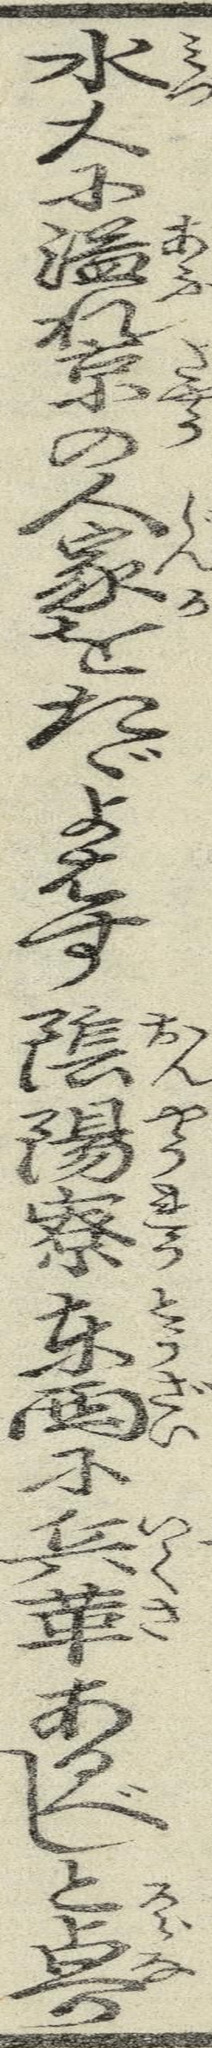水大に溢れ京の人家をたゞよはす陰陽寮東西に兵革あるべしと占へり
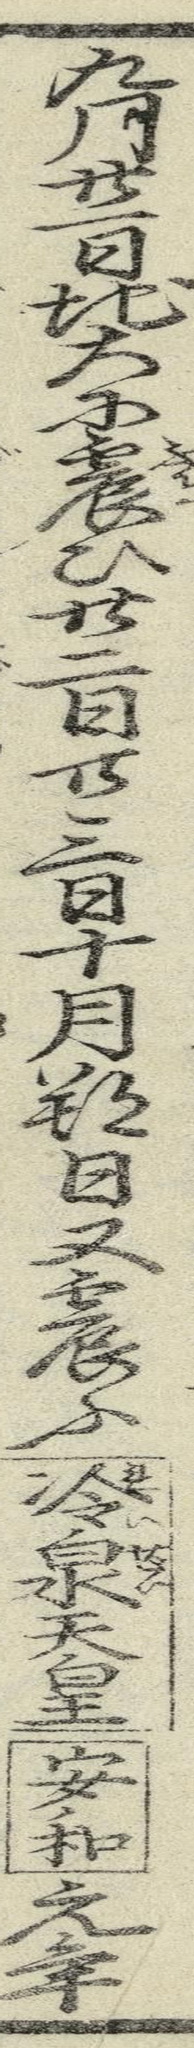九月廿一日地大に震ひ廿二日廿三日十月朔日又震ふ冷泉天皇安和元年
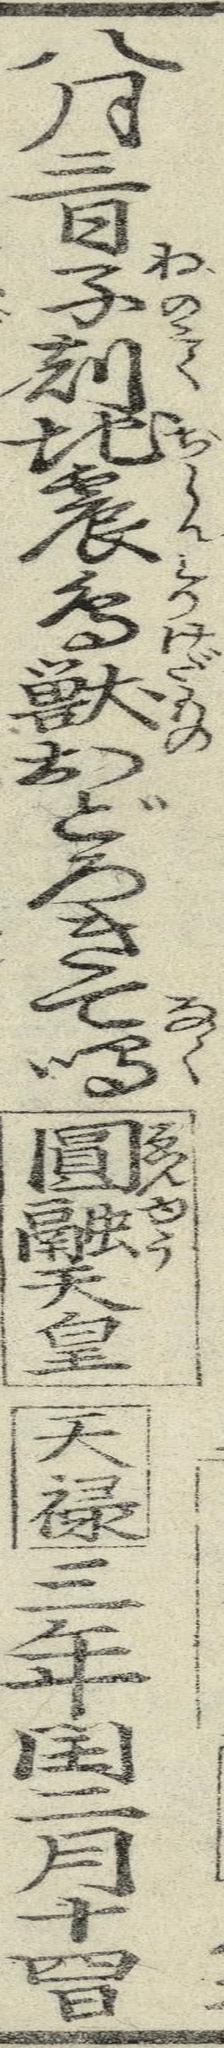八月三日子刻地震鳥獣おどろきて鳴円融天皇天禄三年閏二月十四日
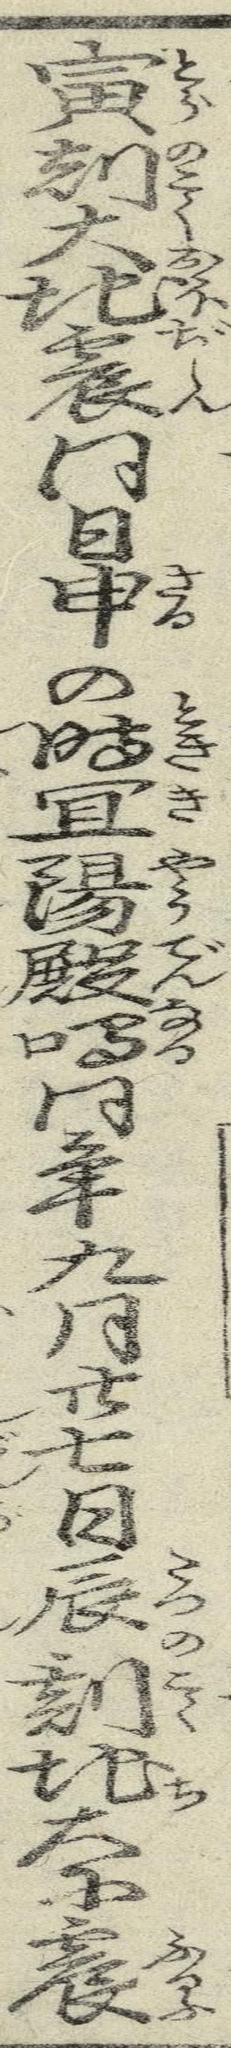寅刻大地震同日申の時宜陽殿鳴同年九月廿七日辰刻地大に震
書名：地震年代記
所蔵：東京大学地震研究所図書室 Earthquake Research Institute Library, The University of Tokyo, JAPAN
